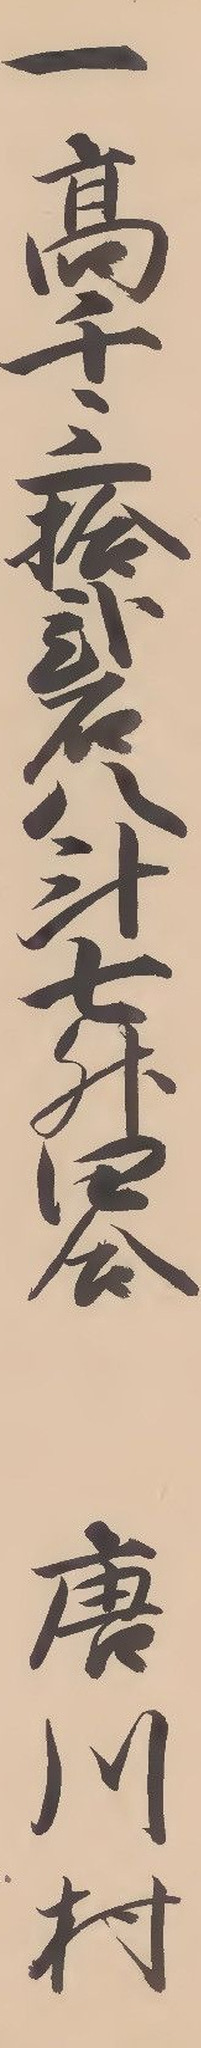一高千三拾弐石八斗七升四合唐川村
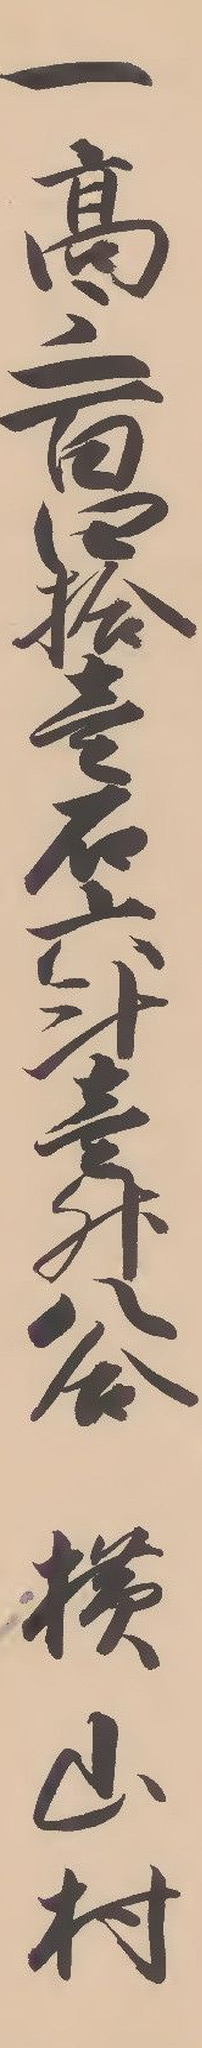一高三百四拾壱石六斗壱升八合横山村

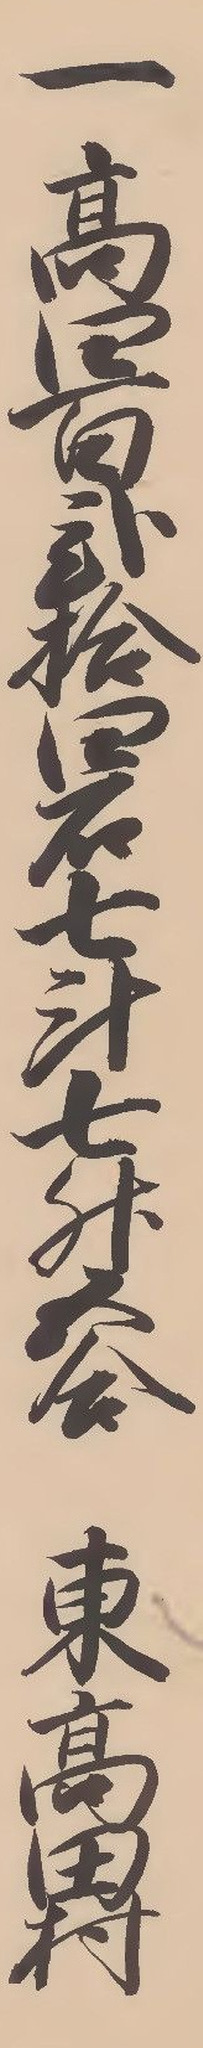一高四百弐拾四石七斗七升五合東高田村
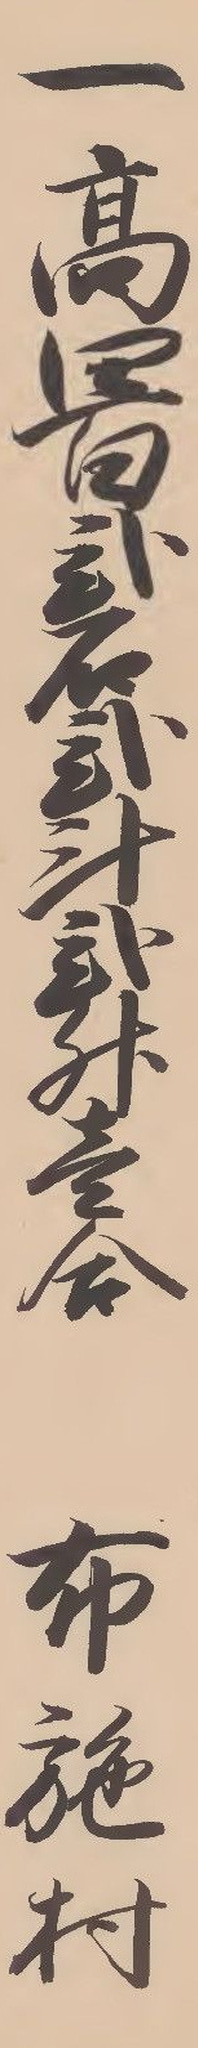一高四百弐石弐斗弐升壱合布施村
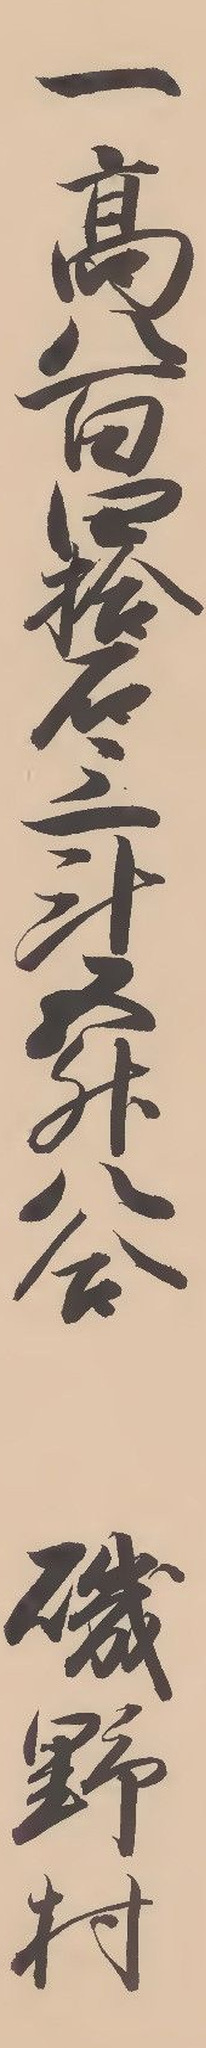一高八百四拾石三斗五升八合磯野村
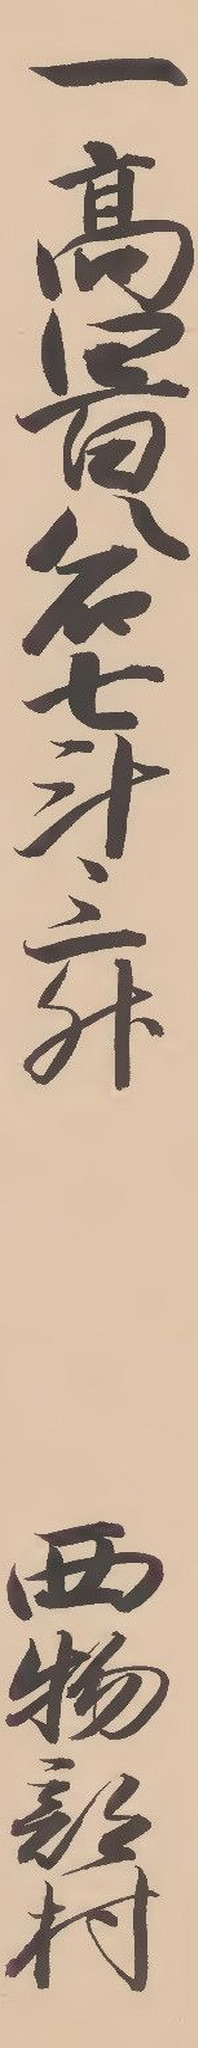一高四百八石七斗三升西物部村
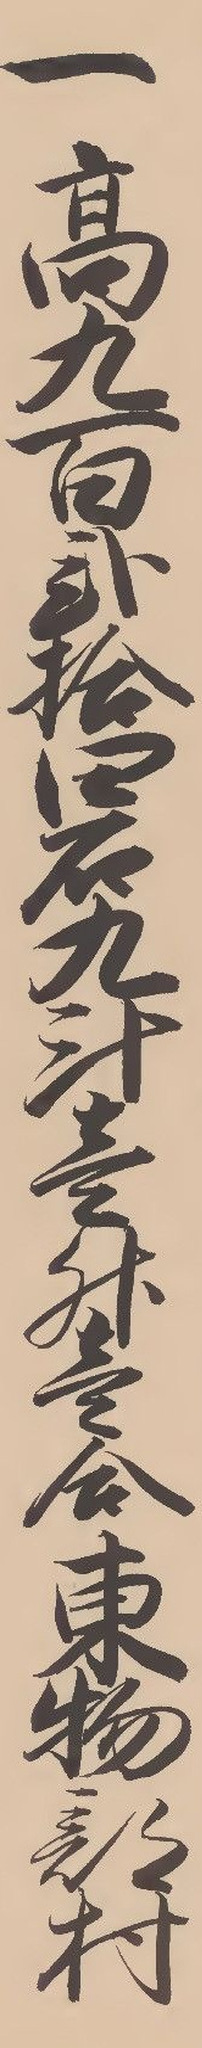一高九百弐拾四石九斗壱升壱合東物部村
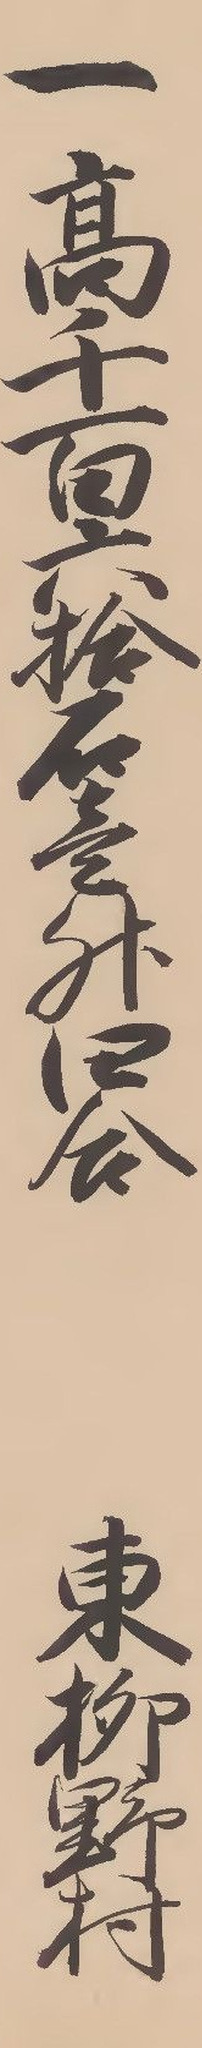一高千百六拾石壱升四合東柳野村
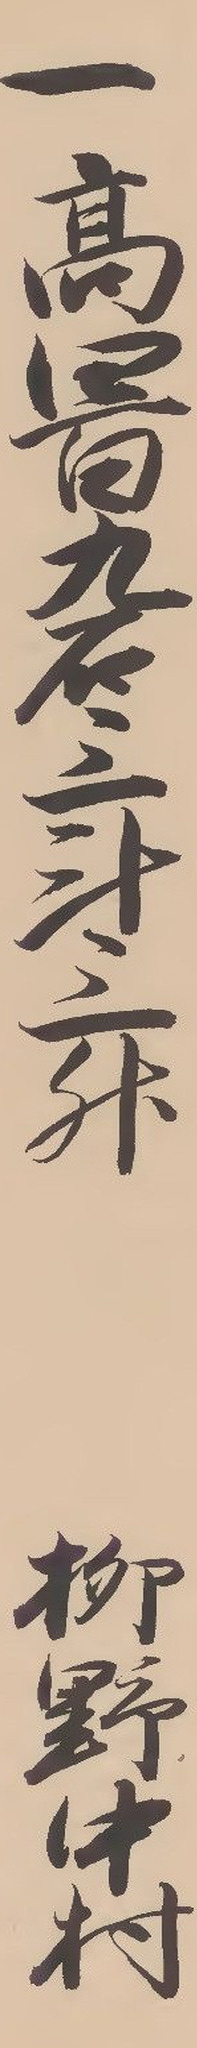一高四百九石三斗三升柳野中村
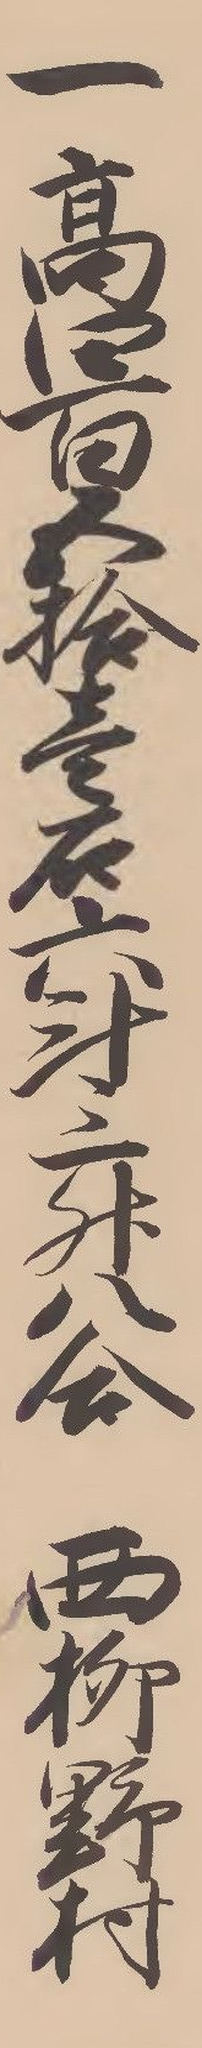一高四百五拾壱石六斗三升八合西柳野村

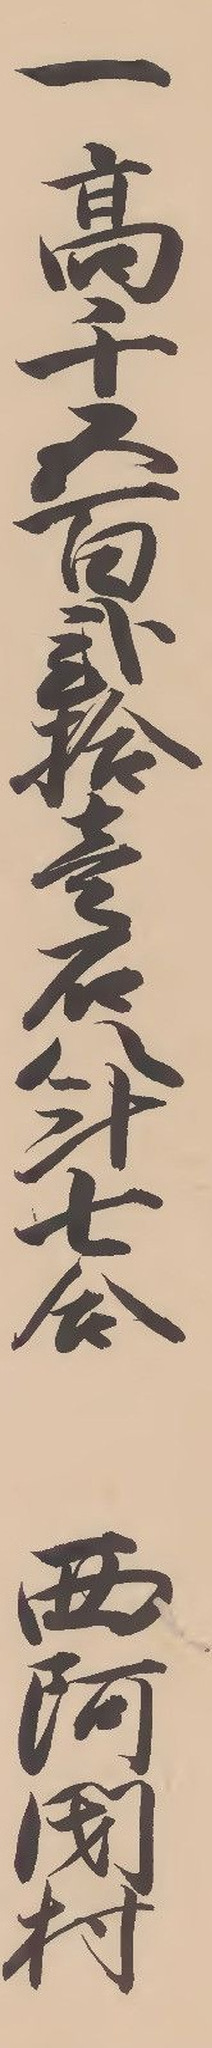一高千五百弐拾壱石八斗七合西阿閉村
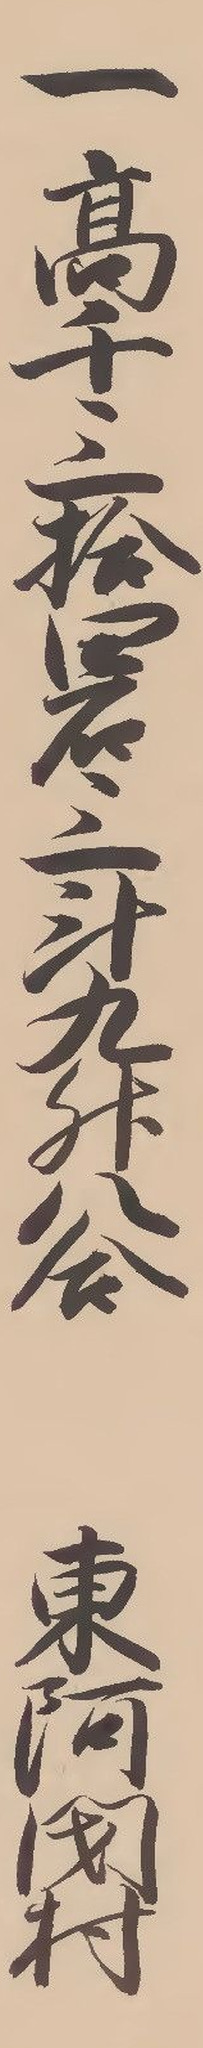一高千三拾四石三斗九升八合東阿閉村
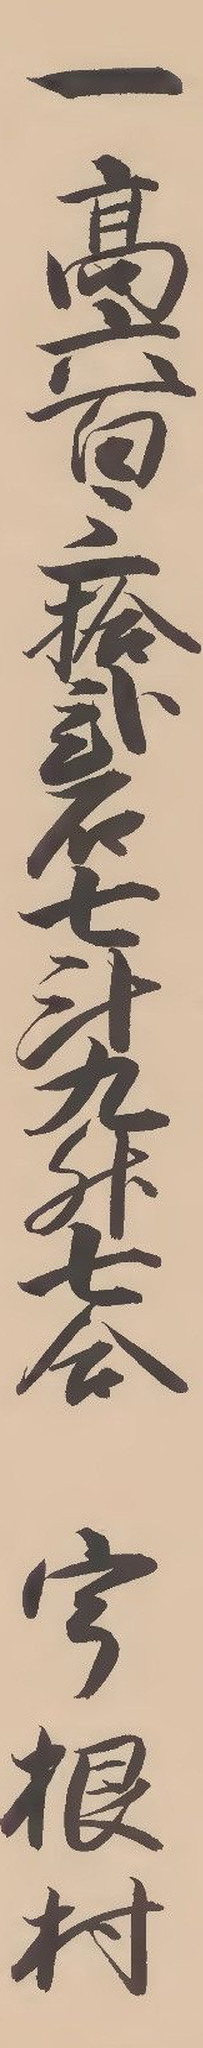一高六百三拾弐石七斗九升七合宇根村
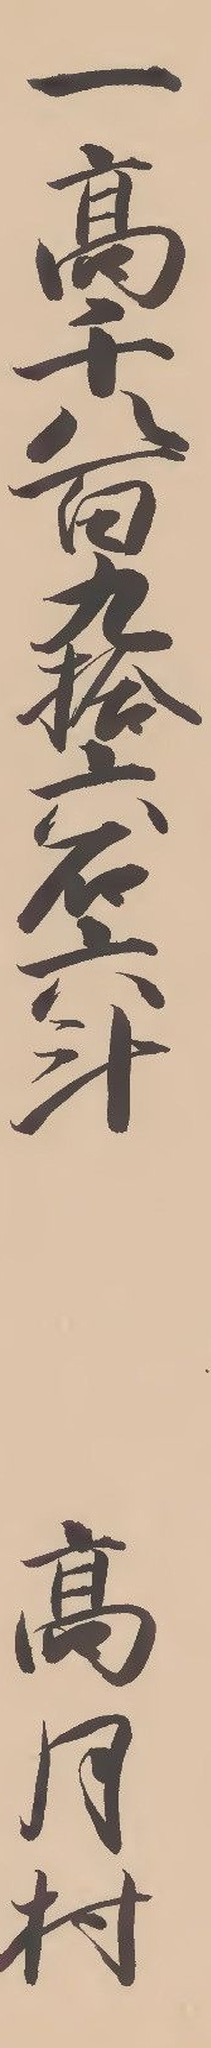一高千八百九拾六石六斗高月村
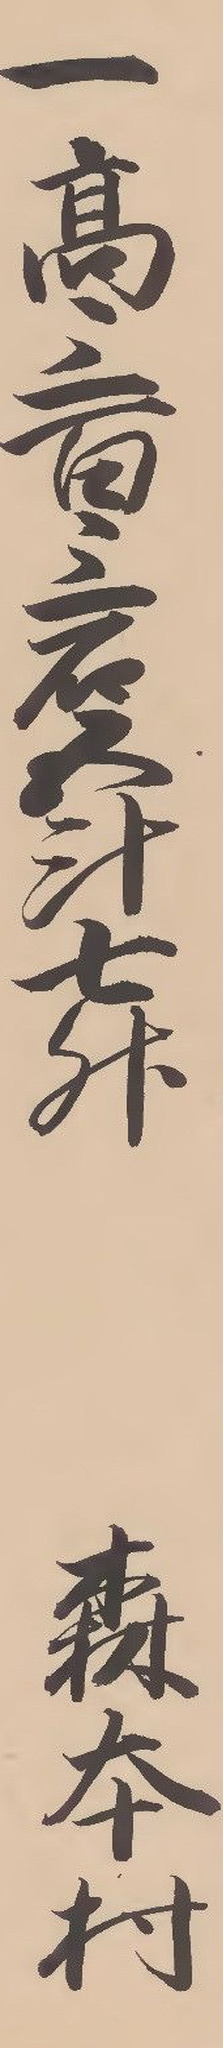一高三百三石五斗七升森本村
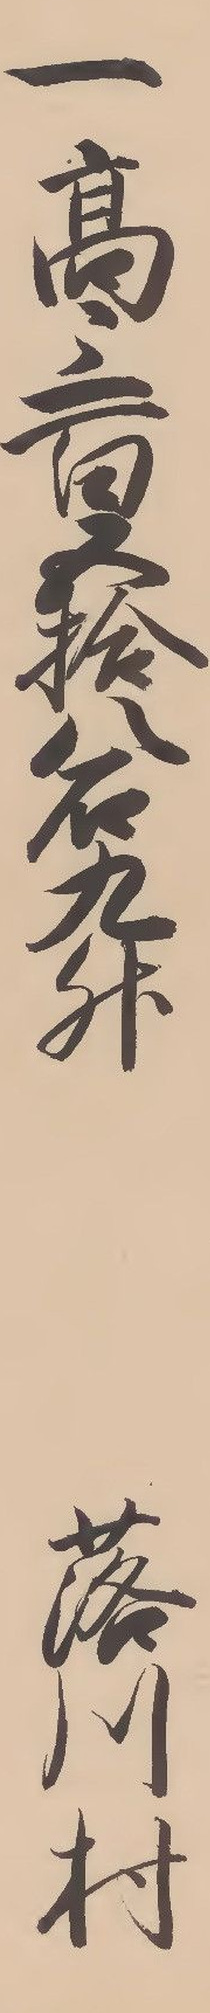一高三百五拾八石九升落川村
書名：近江国郷帳
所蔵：国立公文書館 National Archives of Japan
